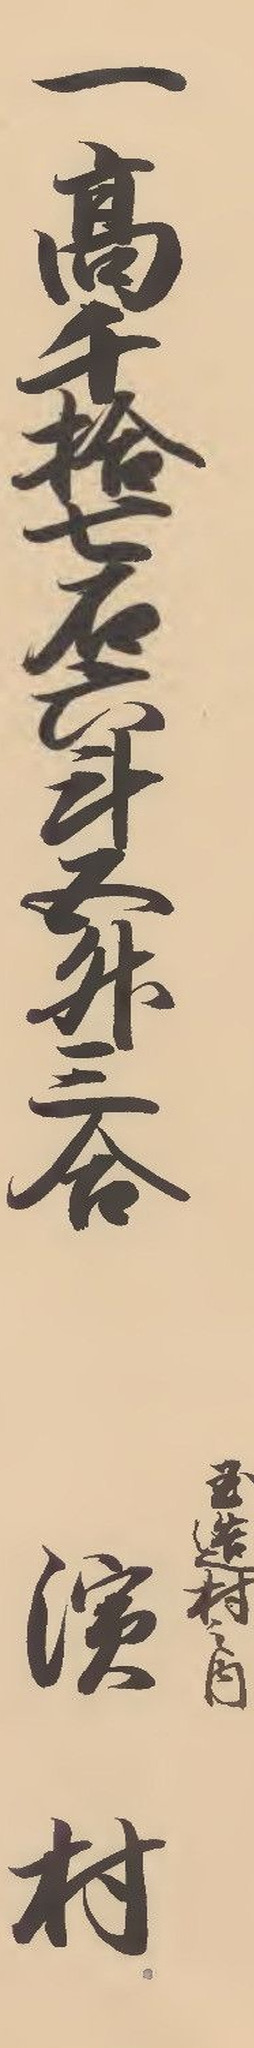一高千拾七石六斗五升三合浜村
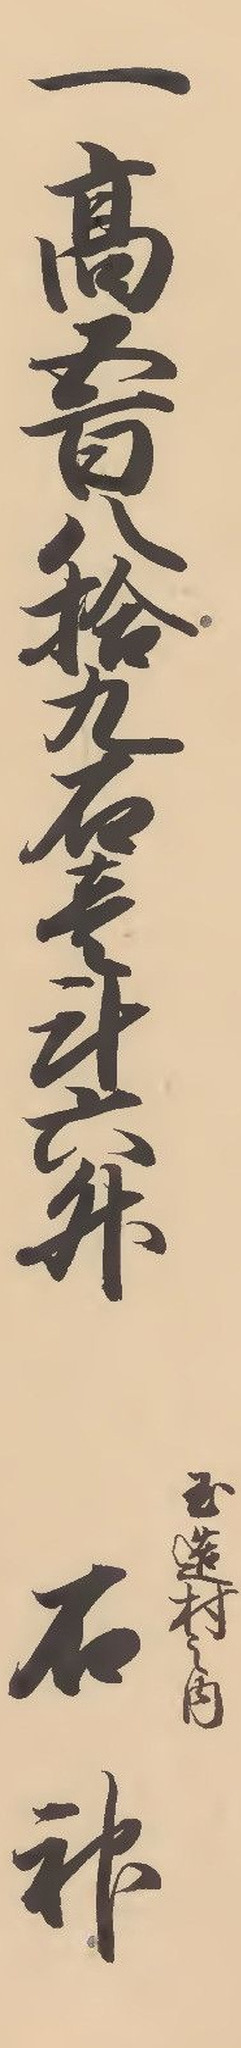一高五百八拾九石壱斗六升石神
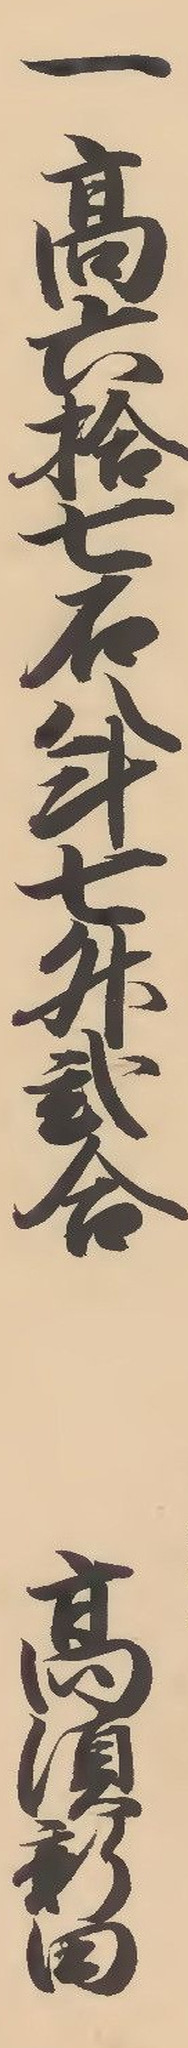一高六拾七石八斗七升弐合高須新田

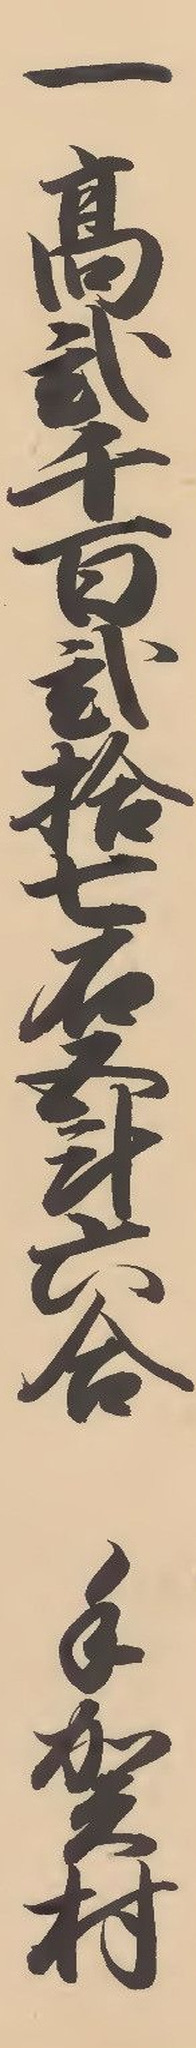一高弐千百弐拾七石五斗六合手賀村
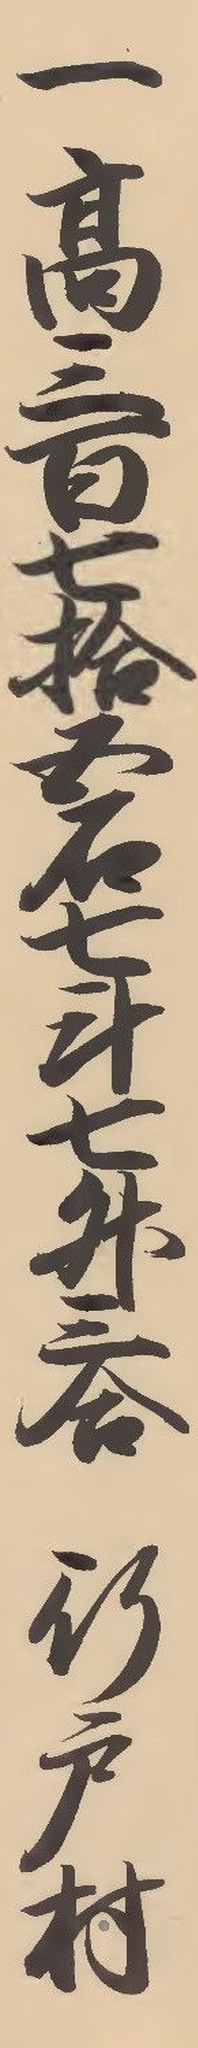一高三百七拾五石七斗七升三合行戸村
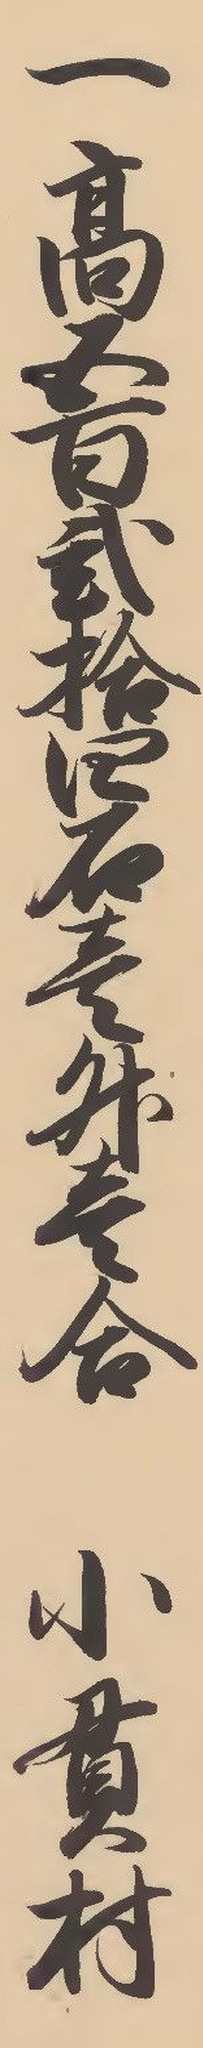一高五百弐拾四石壱升壱合小貫村
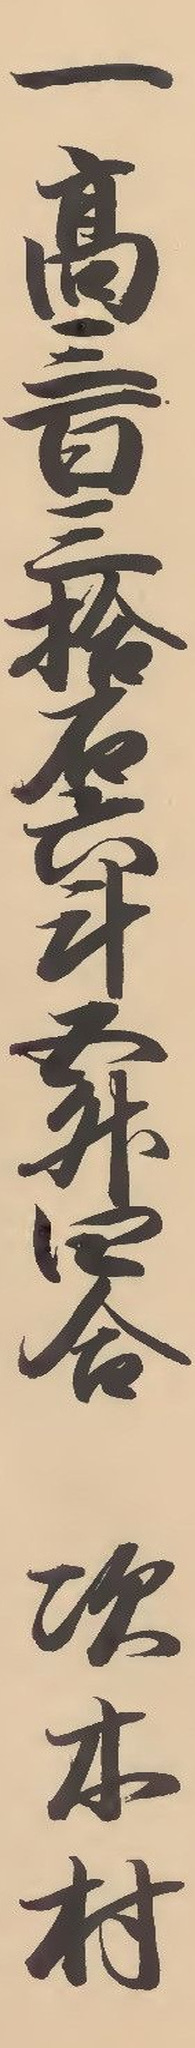一高三百三拾石六斗五升四合次木村
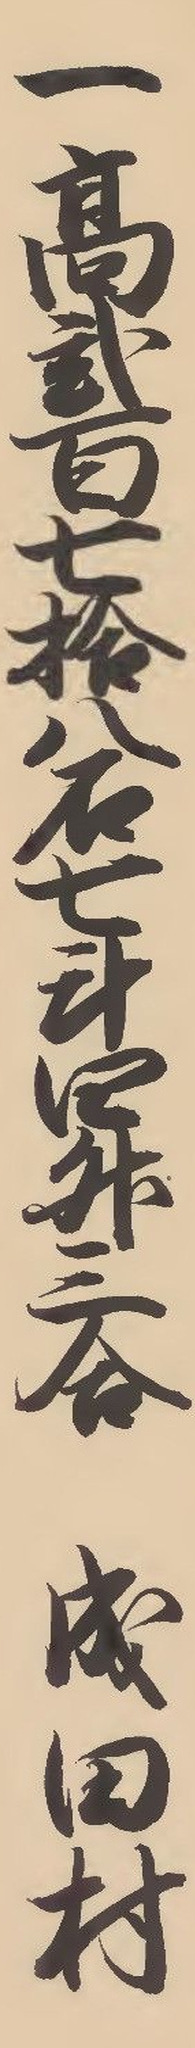一高弐百七拾八石七斗四升三合成田村
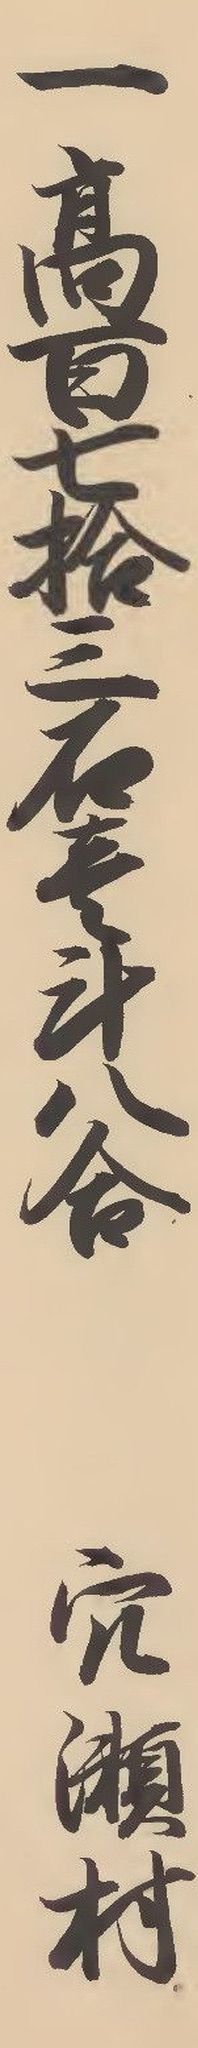一高百七拾三石壱斗八合穴瀬村
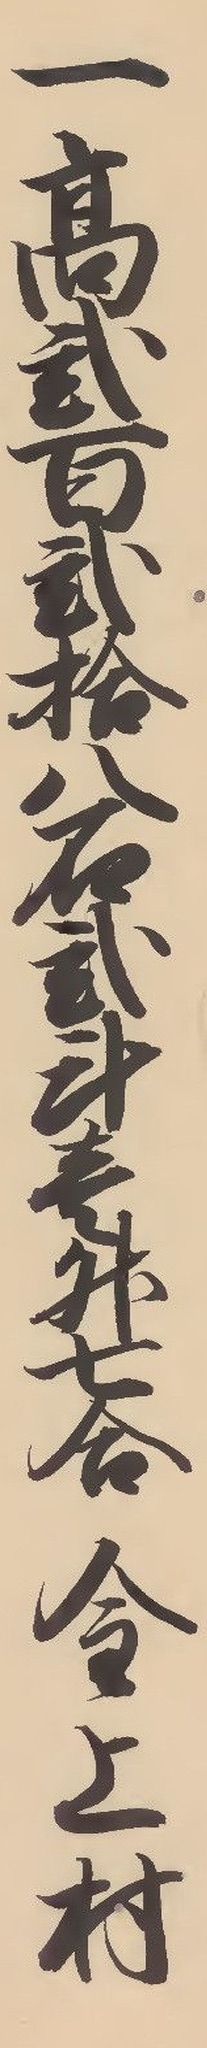一高弐百弐拾八石弐斗壱升七合金上村
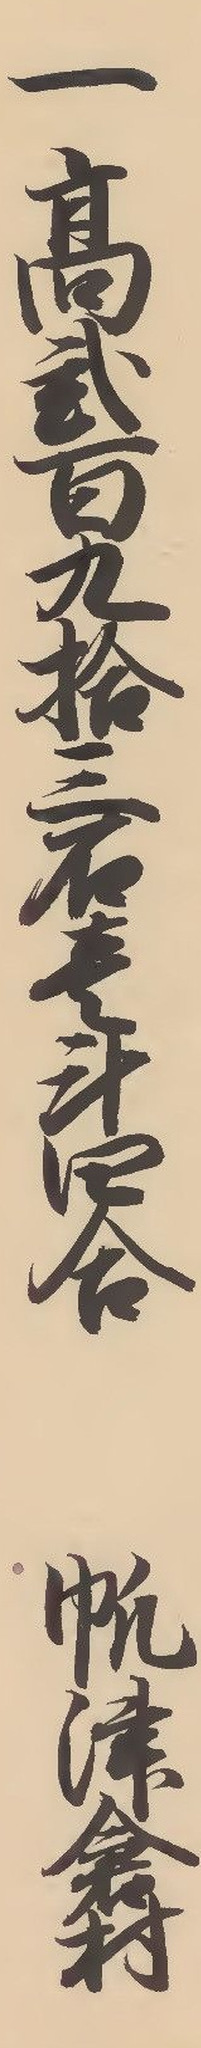一高弐百九拾三石壱斗四合帆津倉村

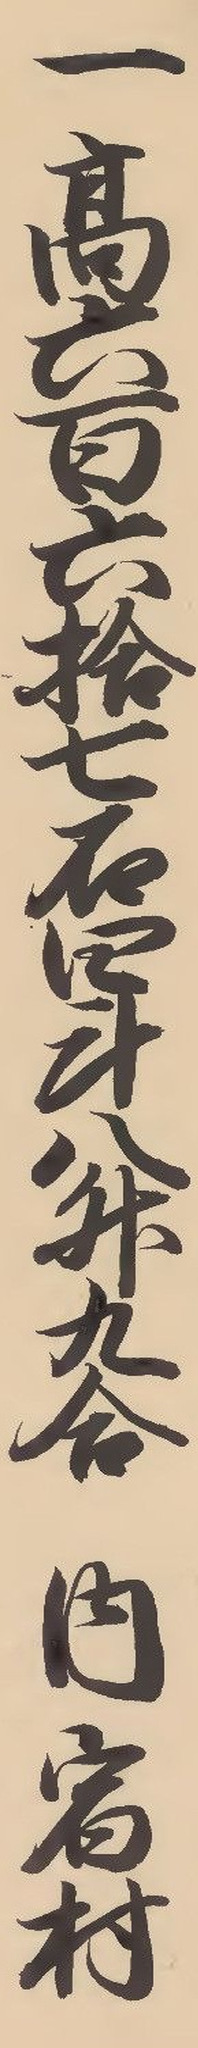一高六百六拾七石四斗八升九合内宿村
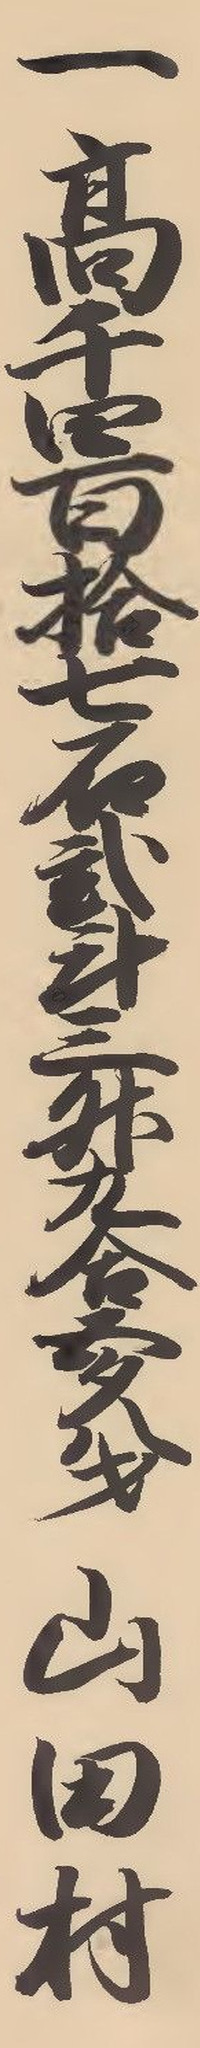一高千四百拾七石弐斗三升九合五勺八才山田村
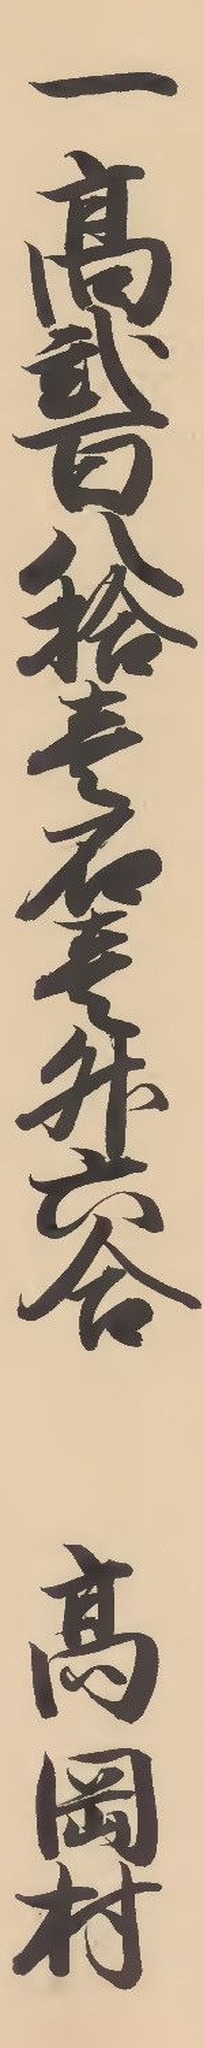一高弐百八拾壱石壱升六合高岡村
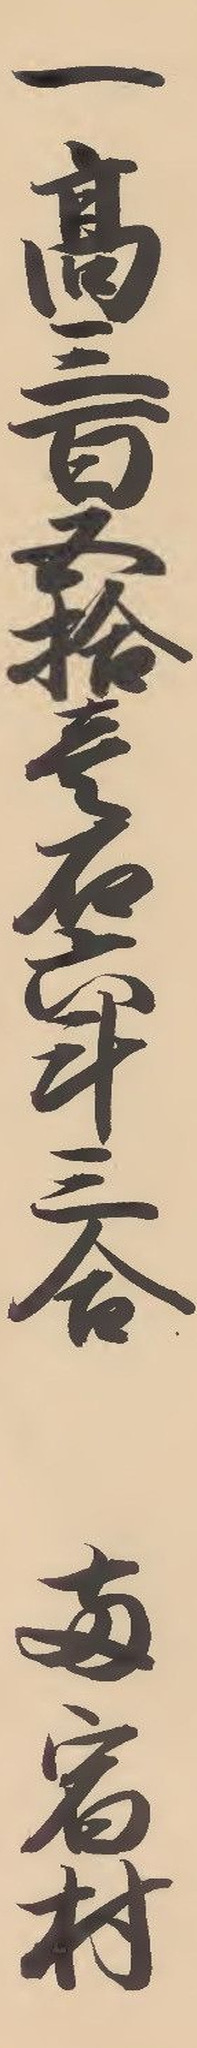一高三百五拾壱石六斗三合両宿村
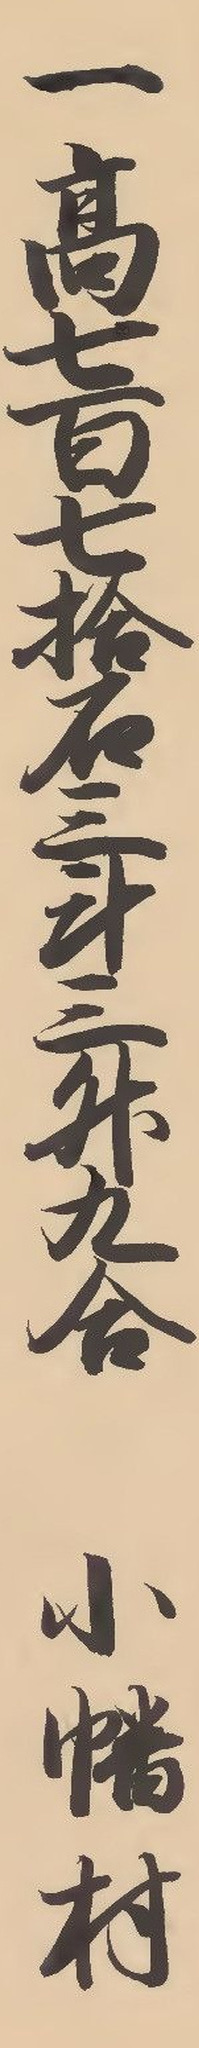一高七百七拾石三斗三升九合小幡村
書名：常陸国郷帳
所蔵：国立公文書館 National Archives of Japan
